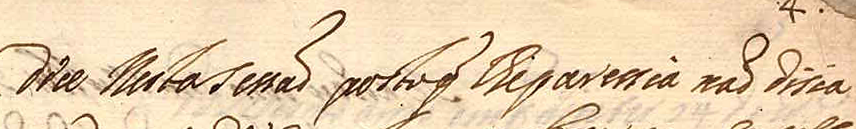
dice Nesta sessão posto q̄ lhe parecia naõ disia
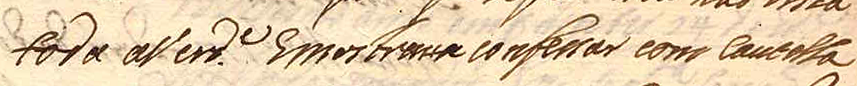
toda a verd.e E mostraua confessar com cautella
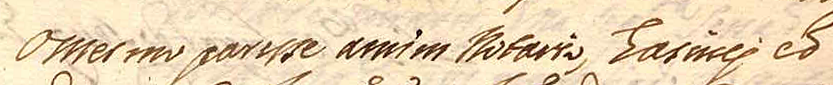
o mesmo paresse a mim notario, E asinej cō
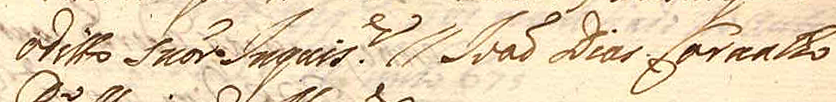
o ditto snor̄ Inquis.or // Ioão Dias Carualho
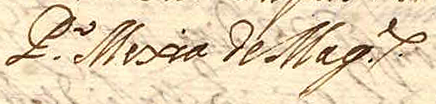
P.o Mexia de Mag.es
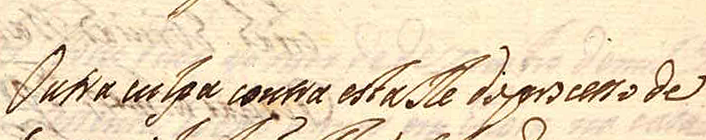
Outra culpa contra esta Re do processo de
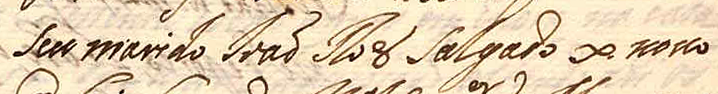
seu marido Ioaõ Roes̄ salgado x. nouo
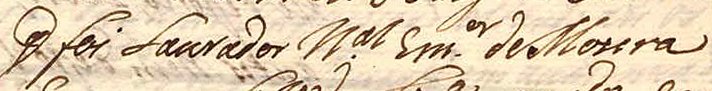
q̄ foi Laurador N.al E m.or de Moura
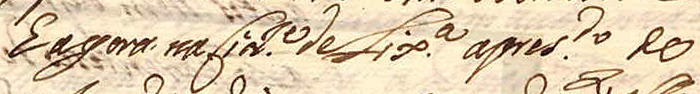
E agora na Cid.e de Lix.a apres.do de
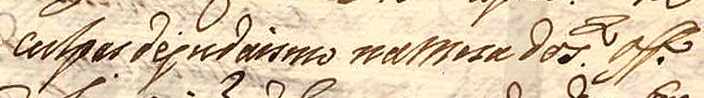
culpas de judaismo na mesa do s.to off.o
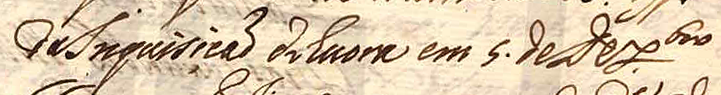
da Inquisição de Euora em 5. de Dez.bro
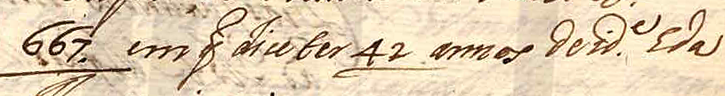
667. em q̄ dice ter 42 annos de id.e E da
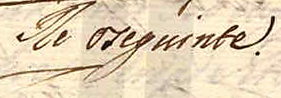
Re o seguinte.
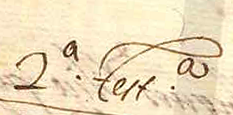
2a test.a
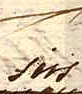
seis
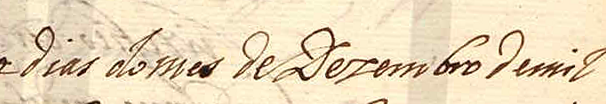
dias do mes de Dezembro de mil
